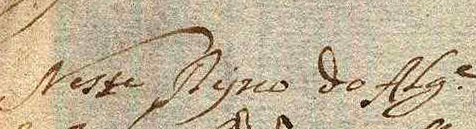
Neste Rejno do Alg.e
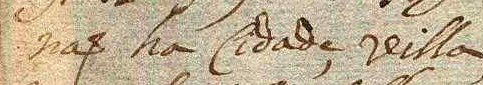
naõ ha Cidade, villa,
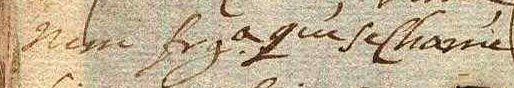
nem frg.a que se Chame
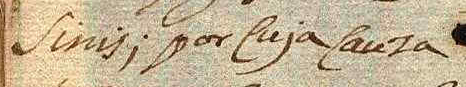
sinis; por Cuja Cauza
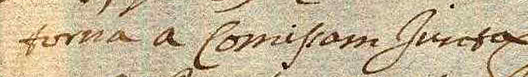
torna a Comissam Junta
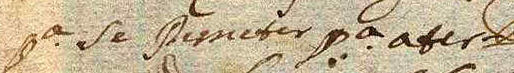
p.a se Remeter p.a a ter
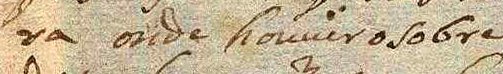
ra onde houuer o sobre
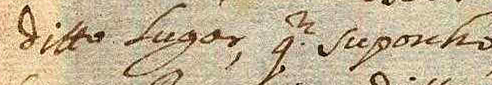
ditto Lugar, q̄. suponho,
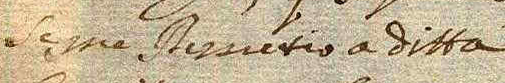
se me Remeteo a ditta
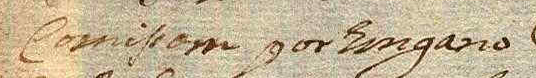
Comissam por Engano
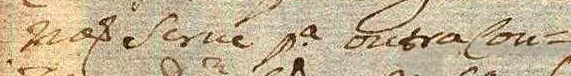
naõ serue p.a outra Cou
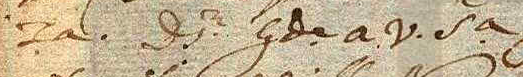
za. Ds. gde a V. S.a
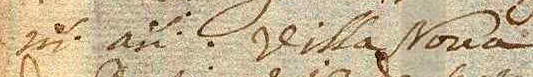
m.s an.s Villa Noua
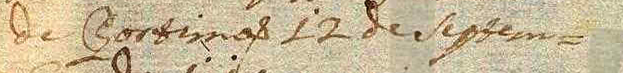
de Portimaõ i2 de septem
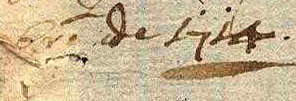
bro de i7i4.
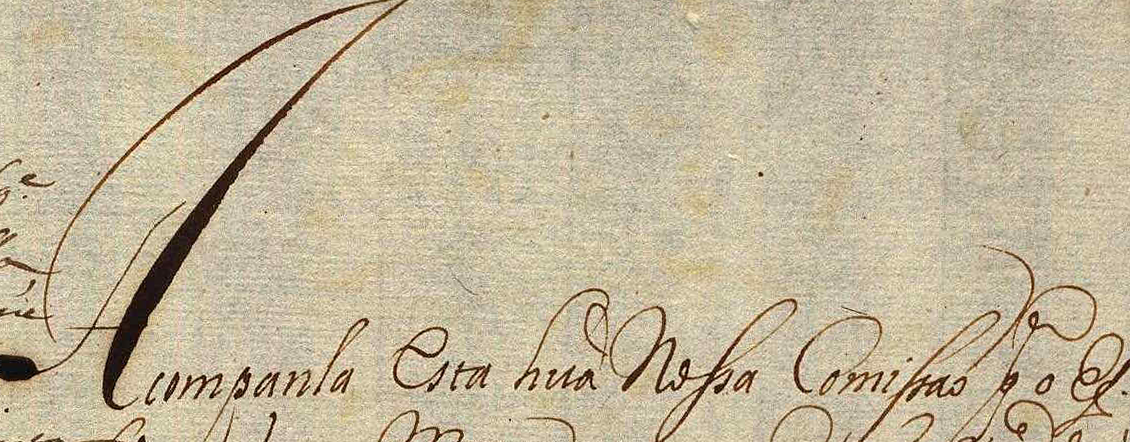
Acompanha Esta huā nossa Comissaõ q̄ o Ef
